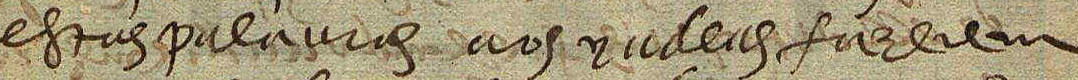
estas palauras aos yudeus fazerem
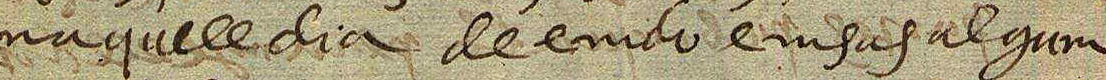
naquele dia de emdoemsas algum
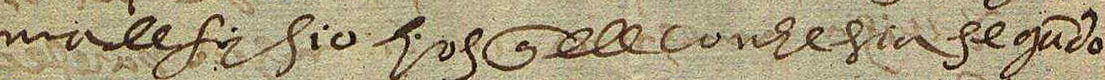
malefysio hos q̄ ele conhecia segūdo
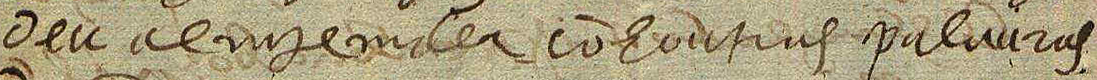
deu a emtemder cō houtras palauras
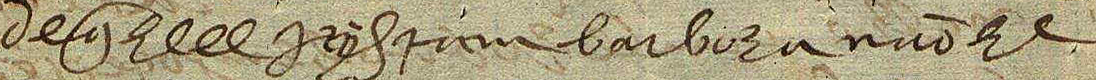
de q̄ helle trystam barboza naõ he
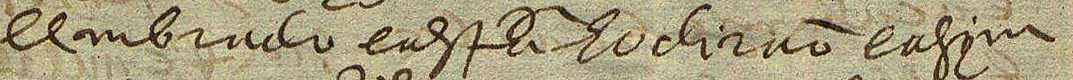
lembrado e as tas ho diraõ e asym
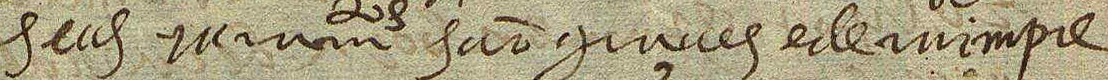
seus yuramtos saõ graues e de ruim pre
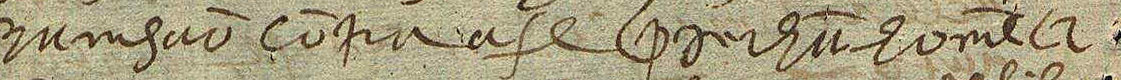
zumsaõ cōtra a fe p̄ ser hū homē cr
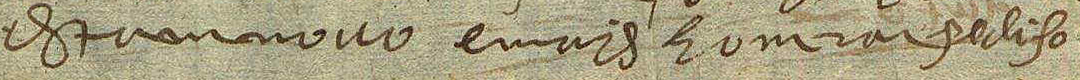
istam nouo e majs homrar se diso
